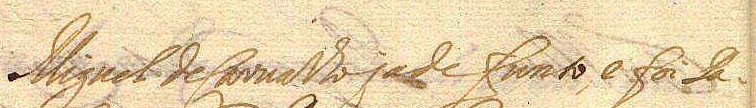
Miguel de Carualho ja defunto, e foi Pa
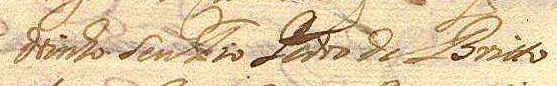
drinho seu Tio Pedro de Britto
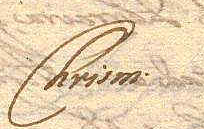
Chrism.
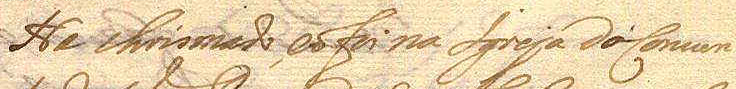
He chrismado, e o foi na Igreja do Conuen
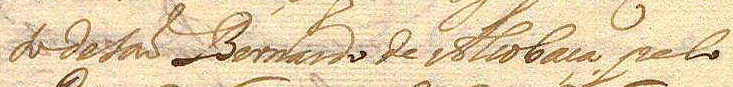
to de saõ Bernardo de Alcobaça, pelo
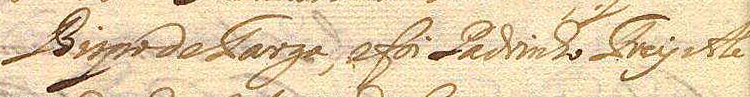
Bispo de Targa, e foi Padrinho Frey Ale
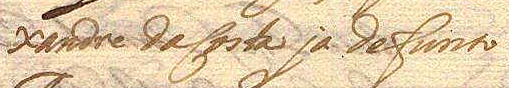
xandre da Costa ja defunto
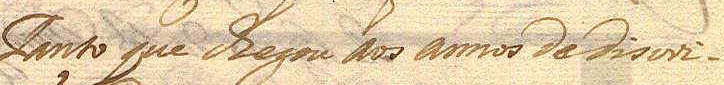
Tanto que chegou aos annos da discri
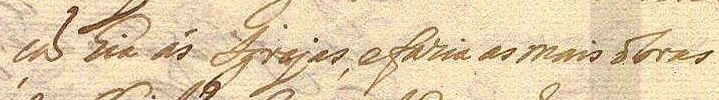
çaõ hia ás Igrejas, e fazia as mais obras
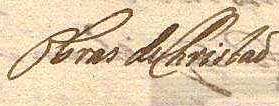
Obras de Christaõ
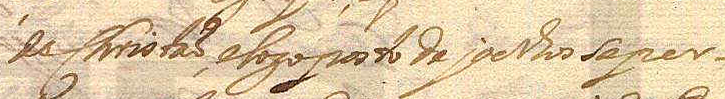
de Christaõ, e logo posto de joelhos se per
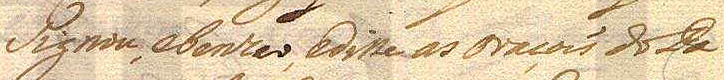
signou, e benzeo, e disse as oraçoĩs do Pa
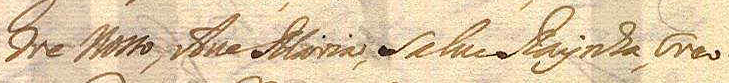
dre nosso, Aue Maria, salue Raynha, creo
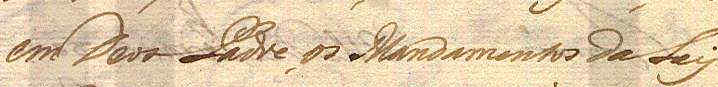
em Deos Padre, os Mandamentos da Ley
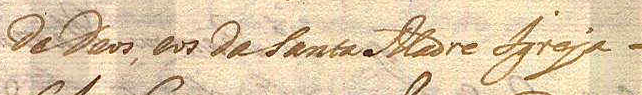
de Deos, e os da Santa Madre Igreja
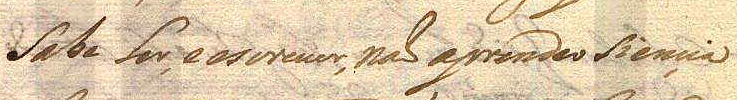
sabe ler, e escreuer, naõ aprendeo siencia
